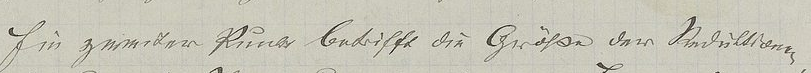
Ein zweiter Punkt betrifft die Größe der Reduktionen,
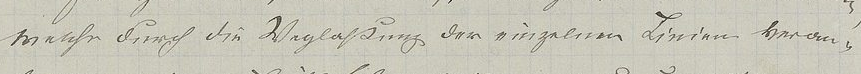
welche durch die Weglaßung der einzelnen Linien veran-
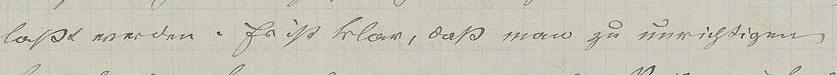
laßt werden. Es ist klar, daß man zu unrichtigen
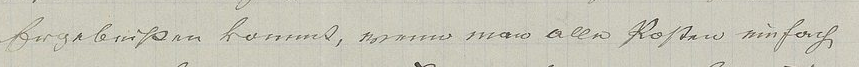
Ergebnißen kommt, wenn man alle Posten einfach
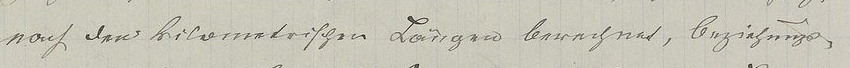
nach den kilometrischen Längen berechnet, beziehungs-
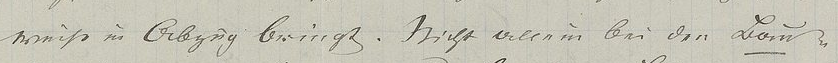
weise in Abzug bringt. Nicht allein bei den Bau-
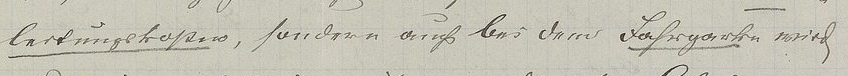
leitungskosten, sondern auch bei dem Fahrparke wird
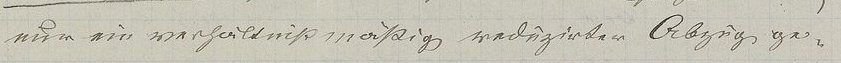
nur ein verhältnißmäßig reduzirter Abzug ge-
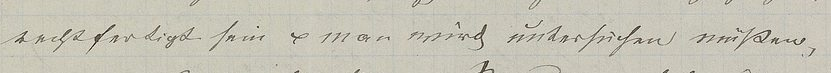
rechtfertigt sein & man wird untersuchen müßen,
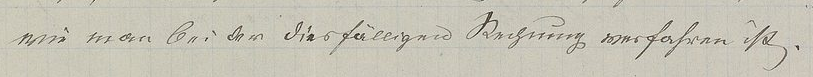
wie man bei der diesfälligen Rechnung verfahren ist.
